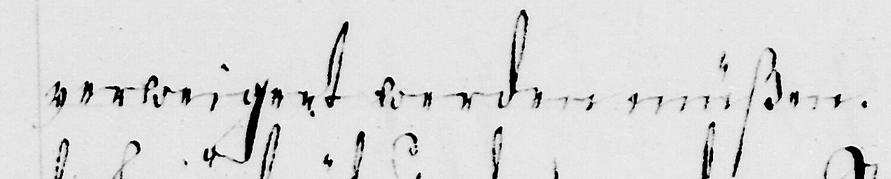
verweigert werden müßen.
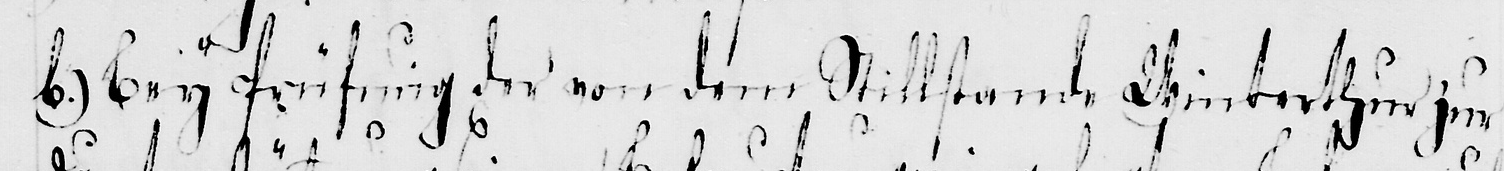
b.) Bey Prüfung der von dem Stillstande Winterthur zur
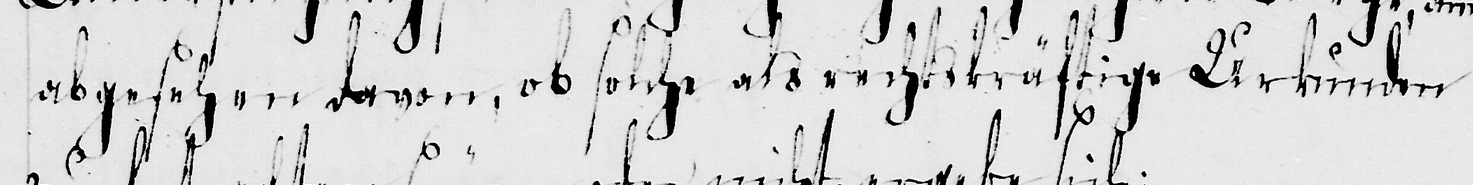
abgesehen davon, ob solche als rechtskräftige Urkunden
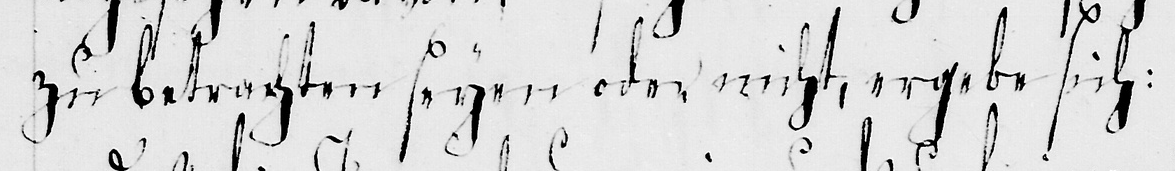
zu betrachten seyen oder nicht, ergebe sich:
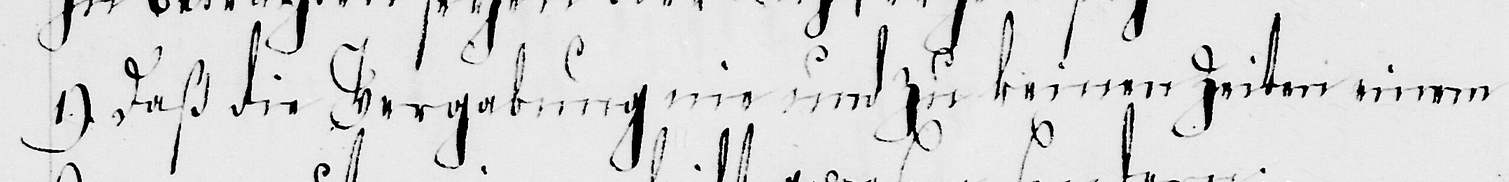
1.) Daß die Vergabung nie und zu keinen Zeiten einem
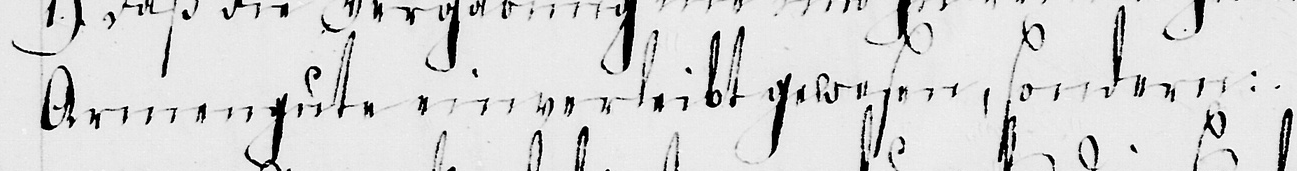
Armengute einverleibt gewesen, sondern:
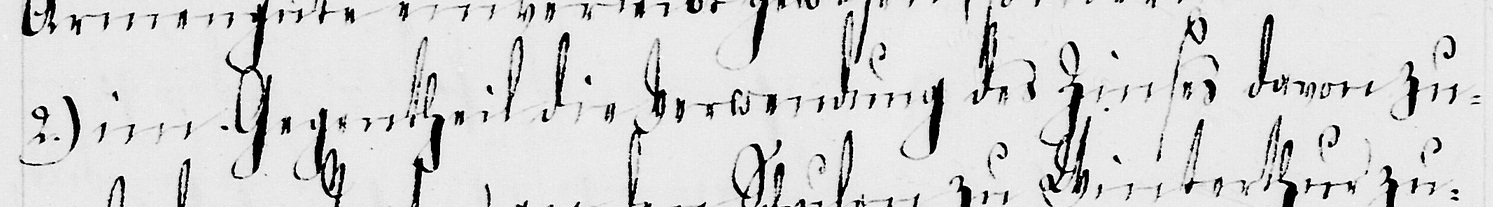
2.) im Gegentheil die Verwendung des Zinses davon zu¬
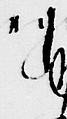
l¬
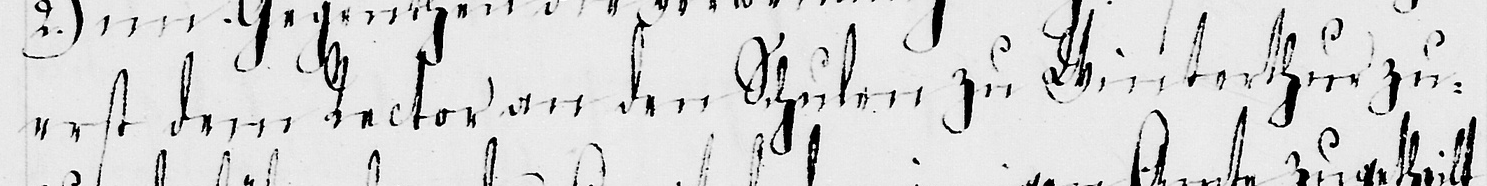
erst dem Rector an den Schulen zu Winterthur zu¬
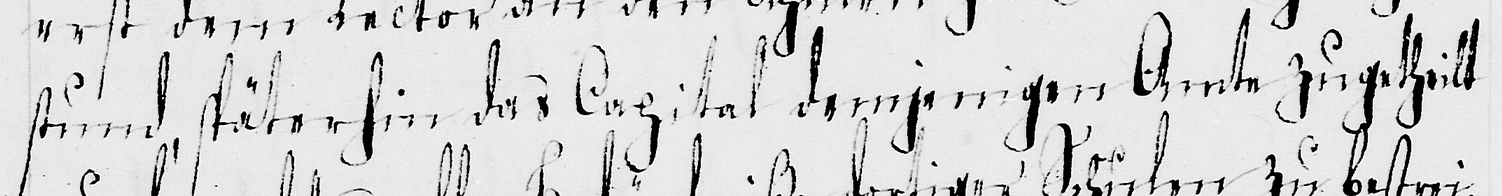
stund, späterhin das Capital demjenigen Amte zugetheilt
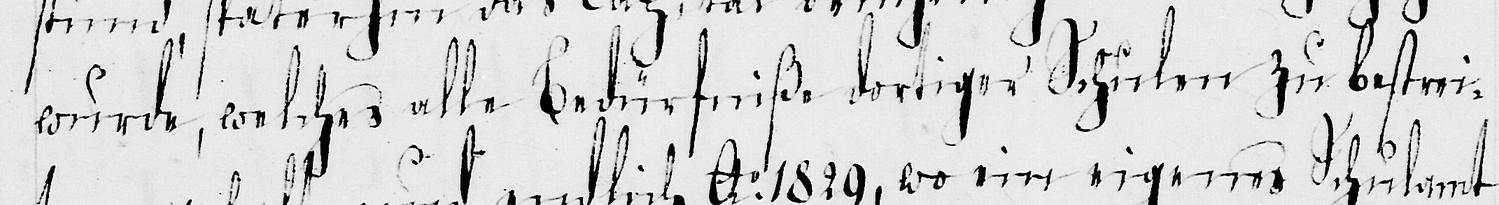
wurde, welches alle Bedürfniße dortiger Schulen zu bestrei¬
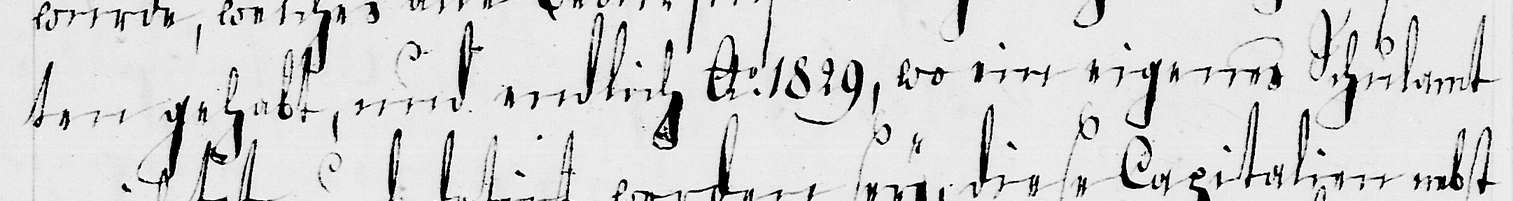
ten gehabt, und endlich A: 1829, wo ein eigenes Schulamt
